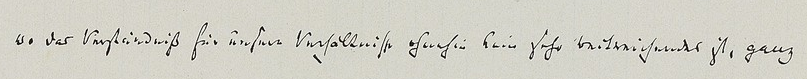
wo das Verständniß für unsere Verhältnisse ohnehin kein sehr weitreichendes ist, ganz
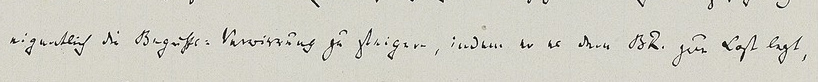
eigentlich die Begriffs-Verwirrung zu steigern, indem er es dem BR. zur Last legt,
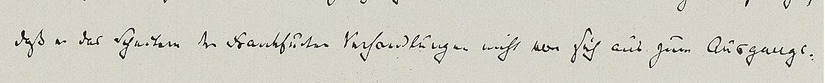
daß er das Schreiben der Frankfurter Verhandlungen nicht von sich aus zum Ausgangs-
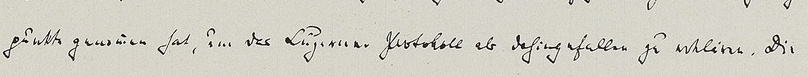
punkte genommen hat, um das Luzerner Protokoll als dahingefallen zu erklären. Die
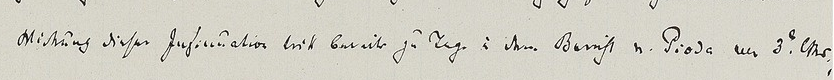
Wirkung dieser Insinuation tritt bereits zu Tage in dem Bericht v. Pioda vm 3t. lMs. ,
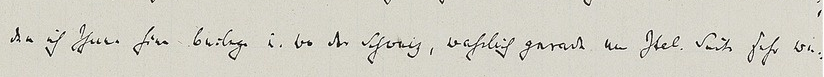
den ich Ihnen hier beilege u. wo der Schweiz, wahrlich gerade vn Ital. Seite sehr we-
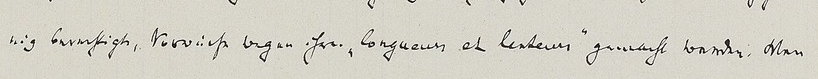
nig berechtigte Vorwürfe wegen ihrer «longueurs et lenteurs» gemacht werden. Wer
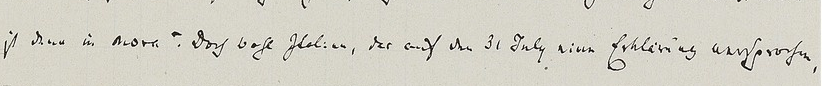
ist denn in mora? Doch wohl Italien, das auf den 31. July eine Erklärung versprochen,
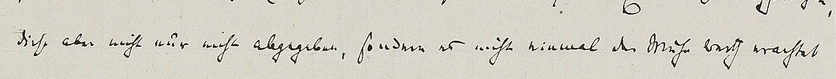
diese aber nicht nur nicht abgegeben, sondern es nicht einmal der Mühe werth erachtet
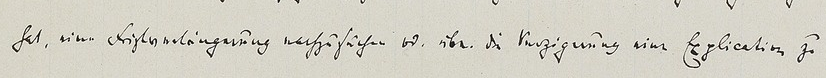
hat, eine Fristverlängerung nachzusuchen od. über die Verzögerung eine Explication zu
